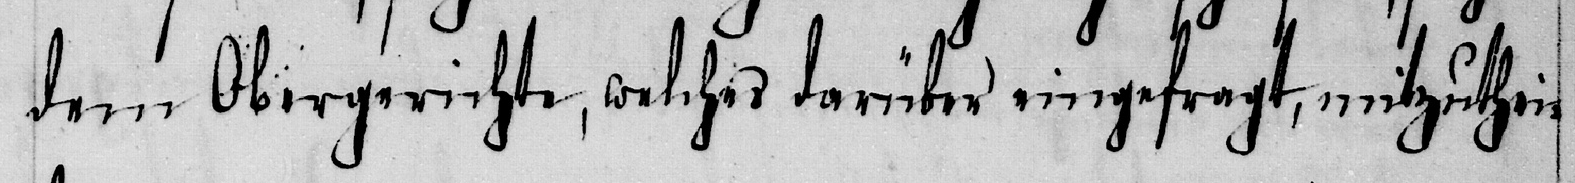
dem Obergerichte, welches darüber eingefragt, mitzuthei¬
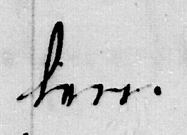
len.
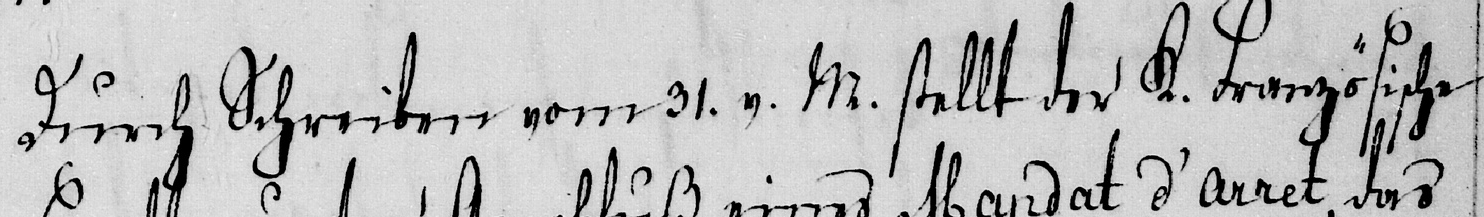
Durch Schreiben vom 31. v. M. stellt der K. Französische
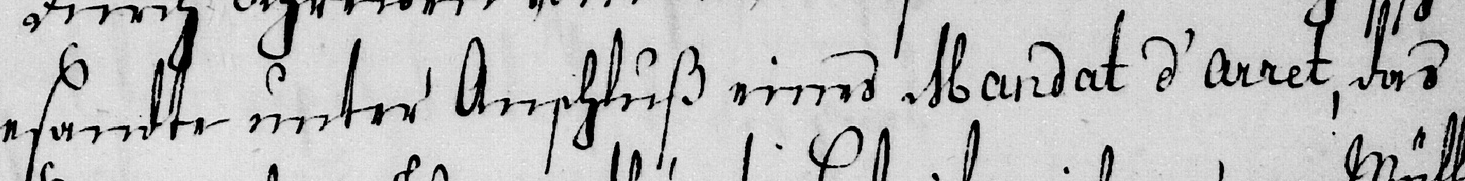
esandte unter Anschluß eines Mandat d’arret das
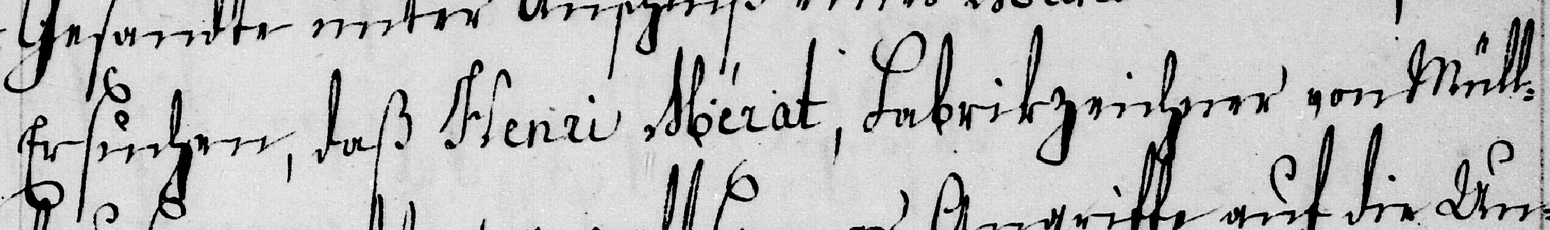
Ersuchen, daß Henri Mérat, Fabrikzeichner von Mül¬
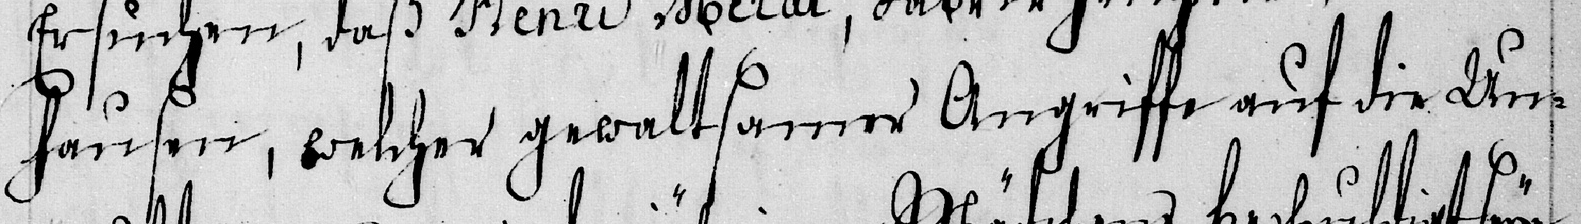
lhausen, welcher gewaltsamer Angriffe auf die Un¬
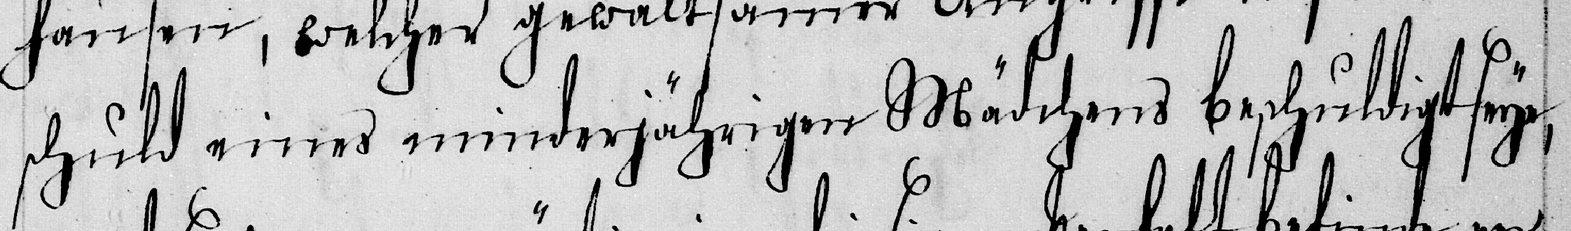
schuld eines minderjährigen Mädchens beschuldigt seye,
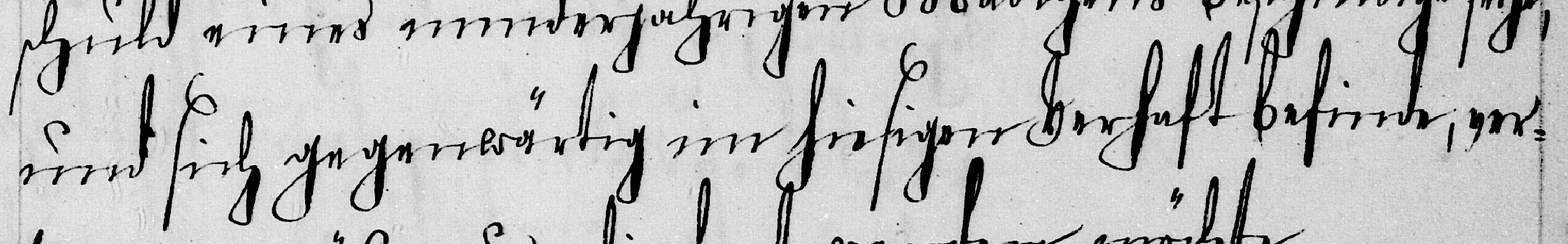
und sich gegenwärtig im hiesigen Verhaft befinde, ver¬
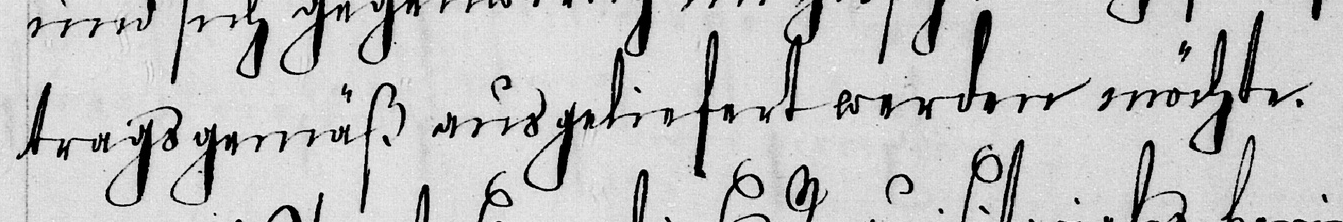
tragsgemäß ausgeliefert werden möchte.
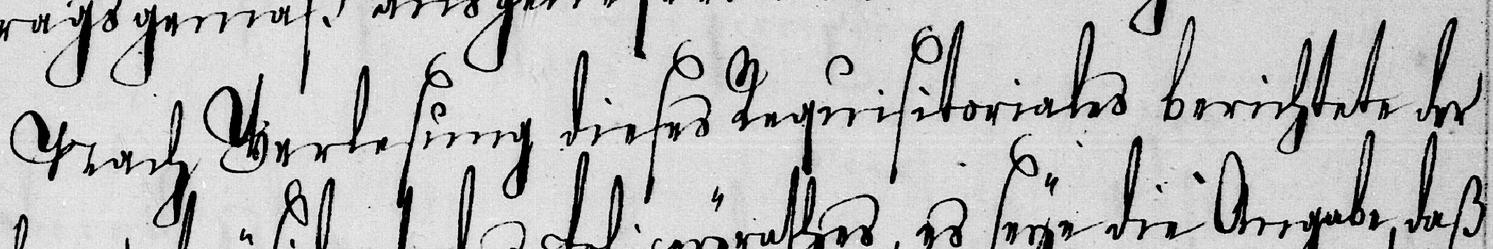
Nach Verlesung dieses Requisitoriales berichtete der
